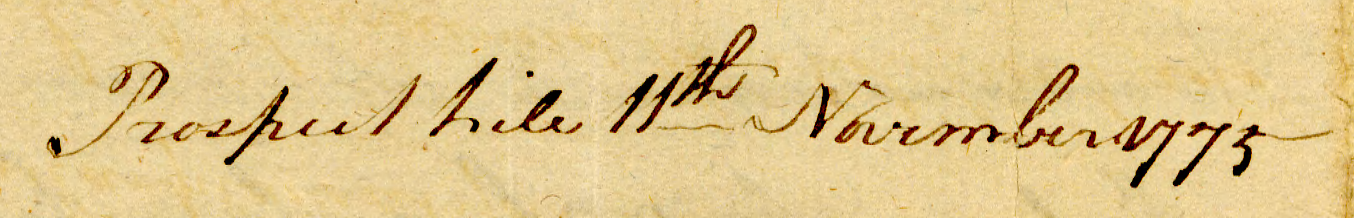Prospect hill 11^th November 1775
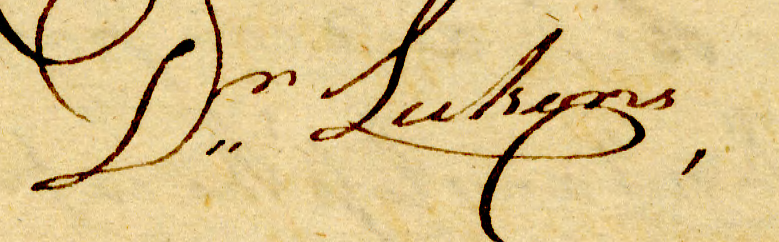D^r. Lukens,
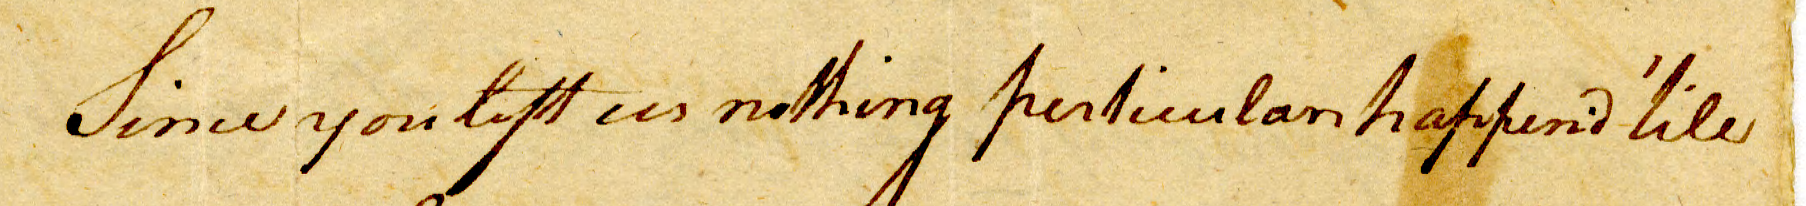Since you left us nothing perticular happened 'till
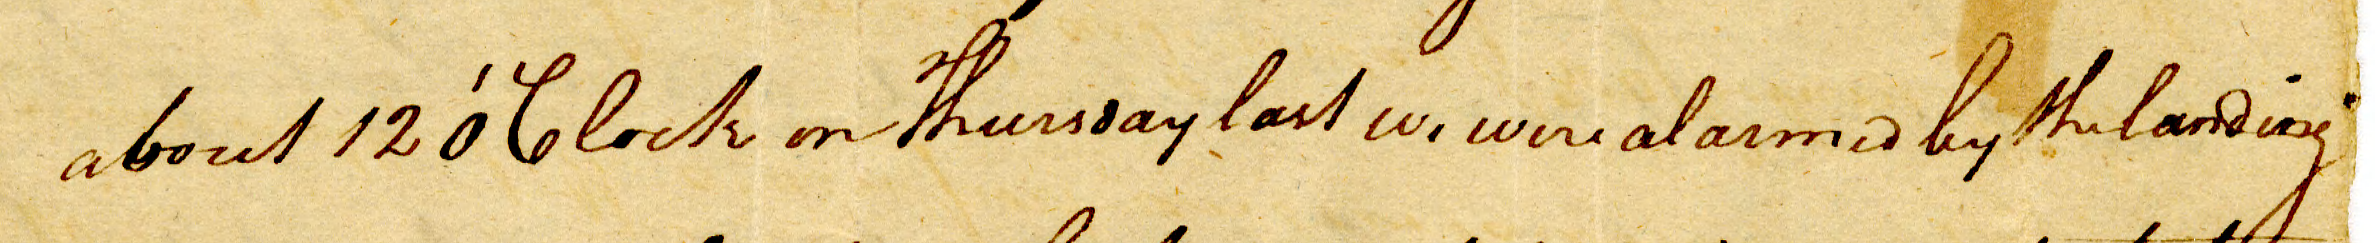about 12 o'Clock on Thursday last we were alarmed by the landing
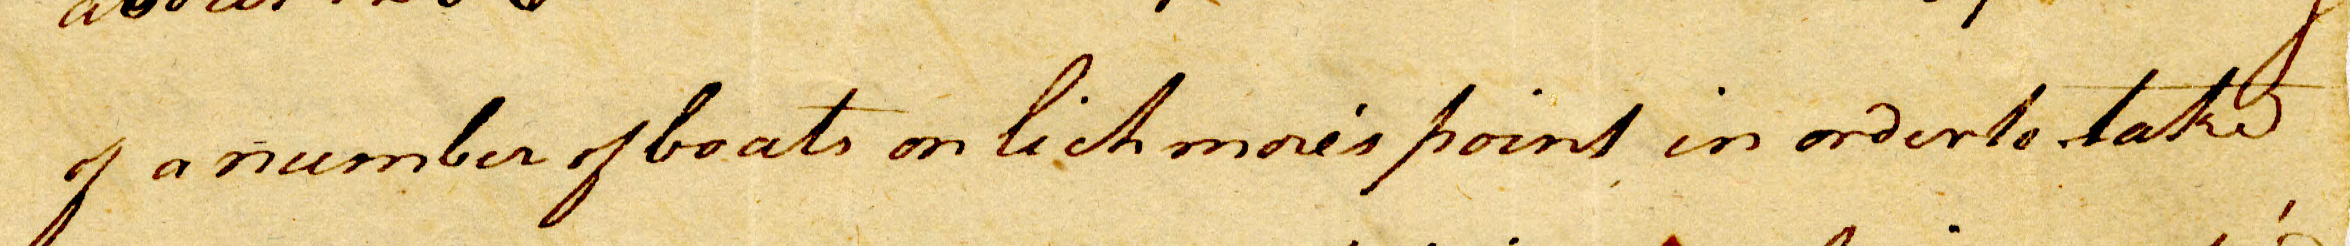of a number of boats on lichmore's point in order to take
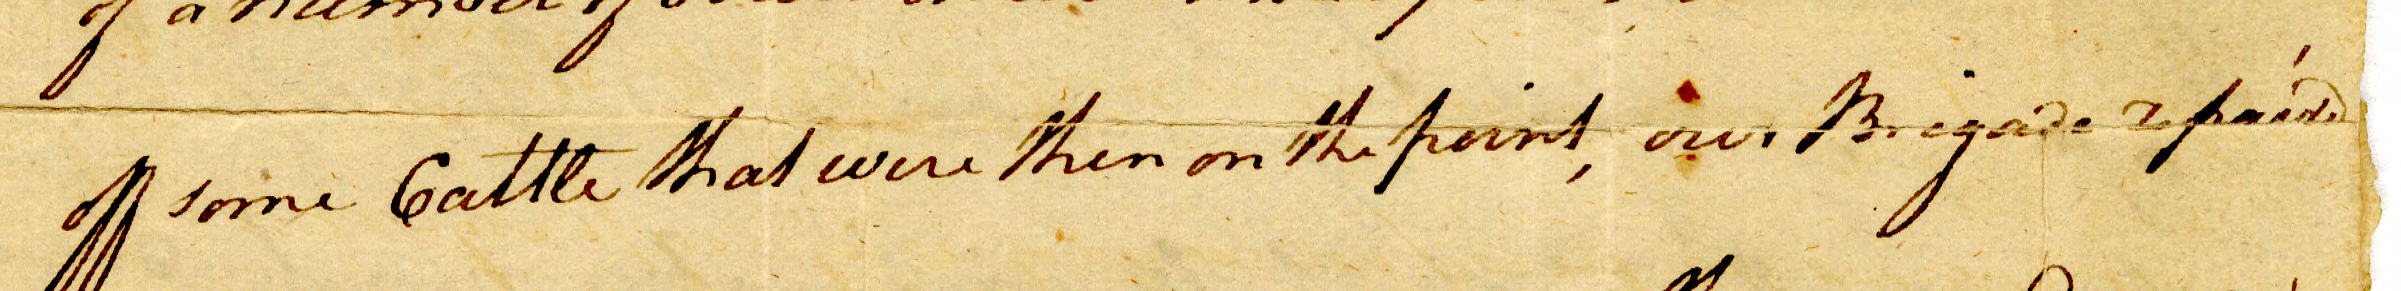off some Cattle that were then on the point, our Brigade depart'd
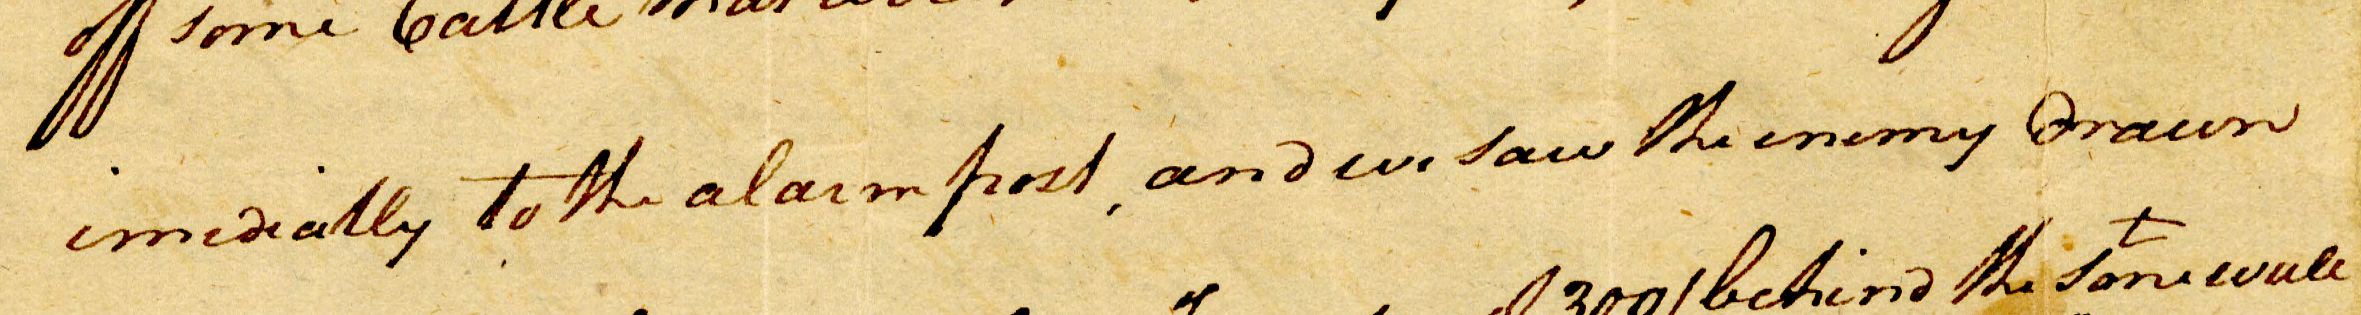imediately to the alarm post, and we saw the enemy drawn
